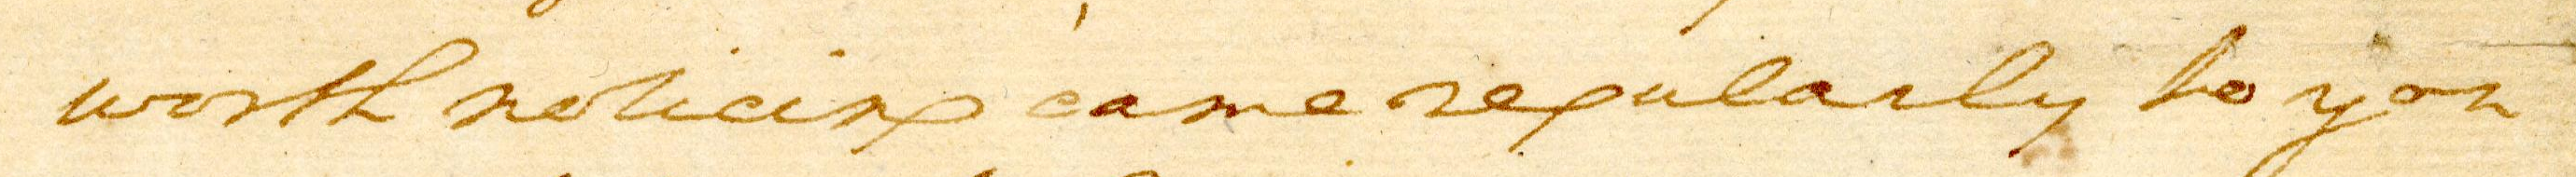worth noticing came regularly to you
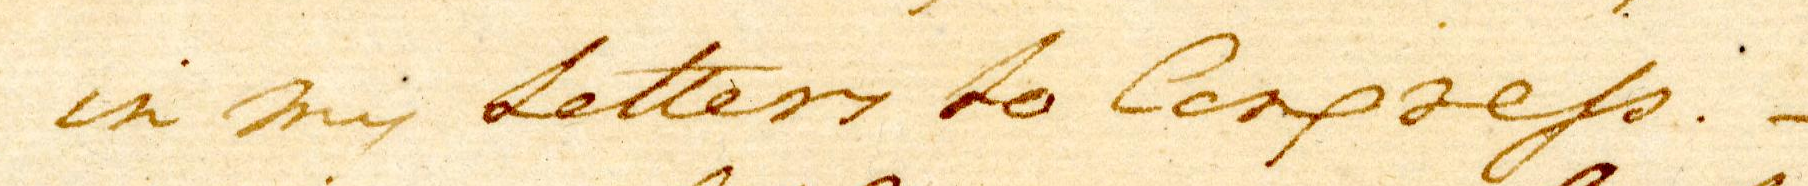in my Letters to Congress.
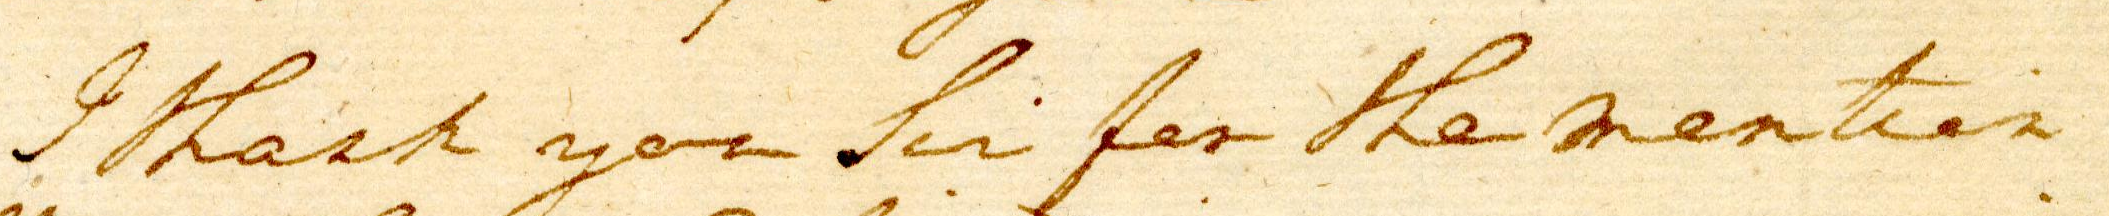I thank you sir for the mention
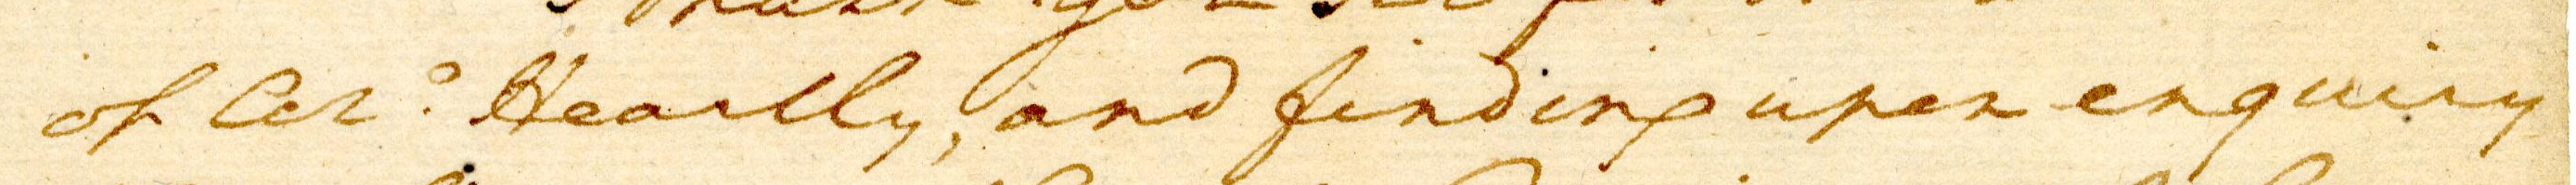Of Col^o. Hearlly, and finding upon enquiry
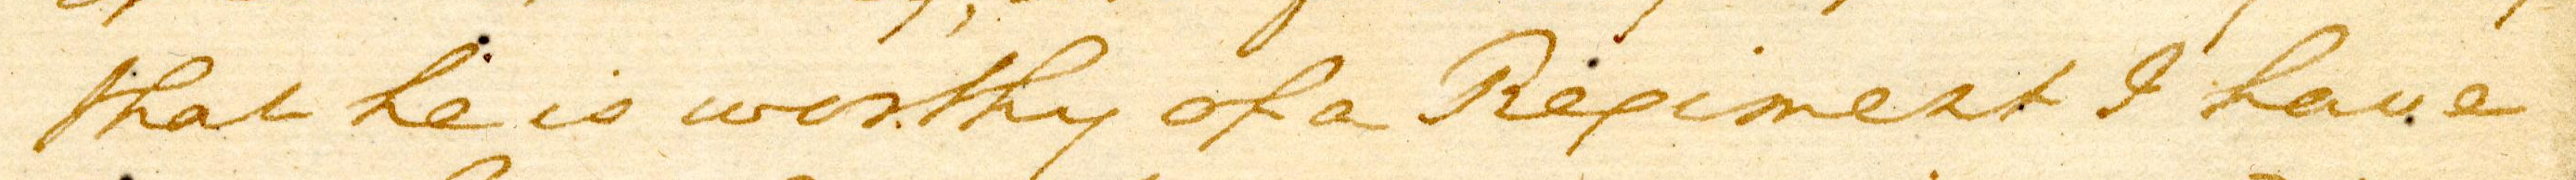that he is worthy of a Regiment I have
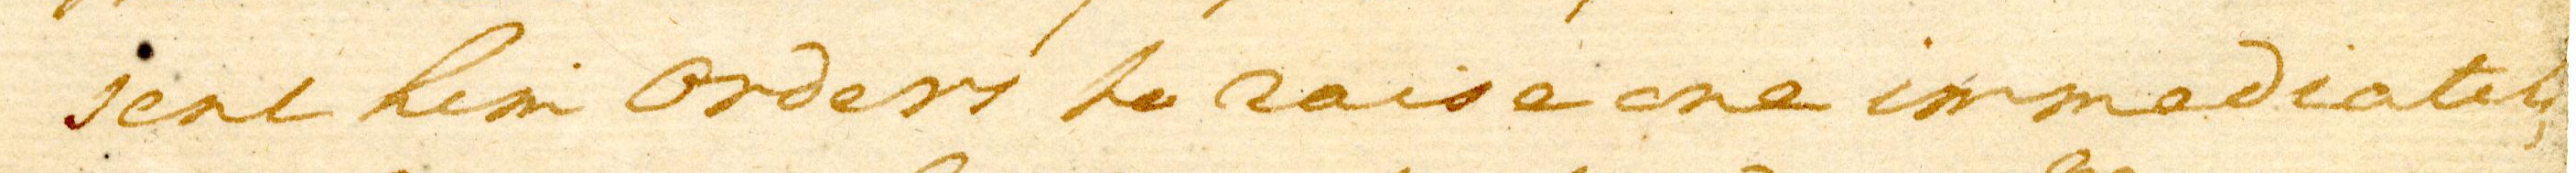sent him Orders he raise one immediately
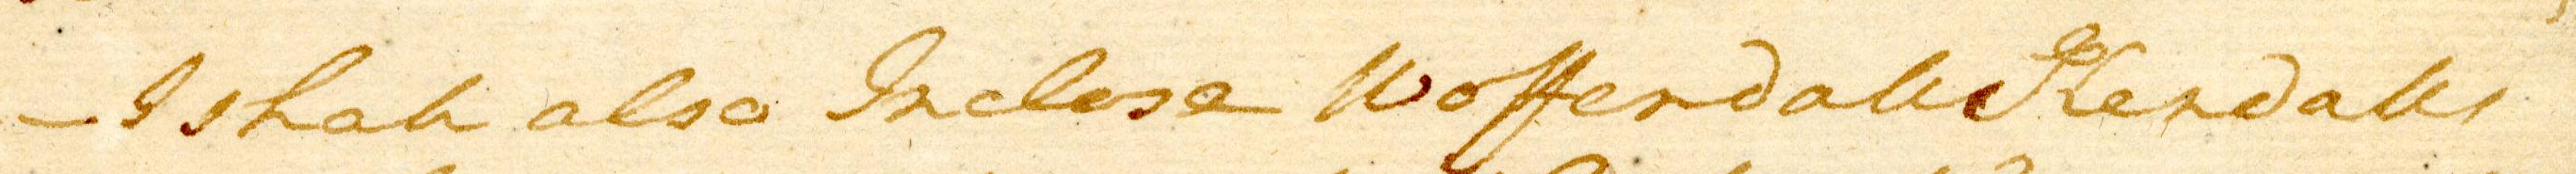- I shall also Inclose Woffendall Kendalls
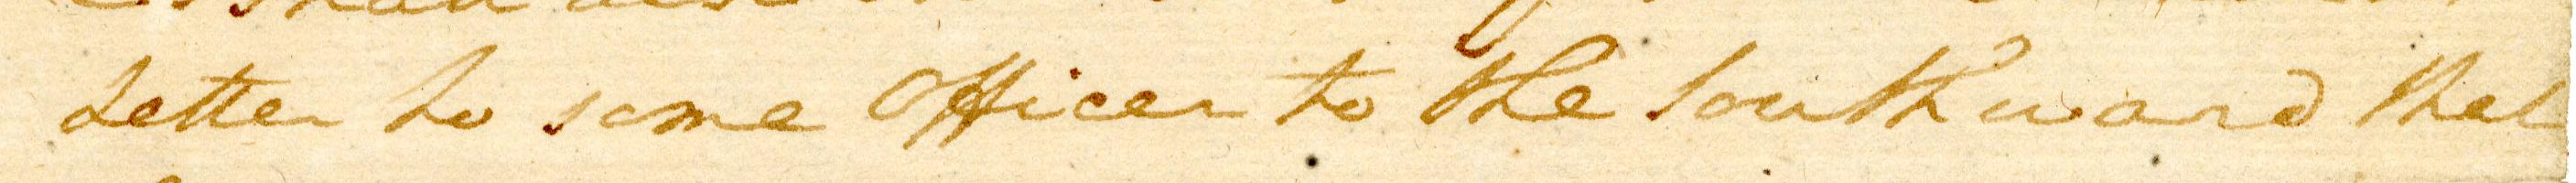Letter to some officer to the Southward that
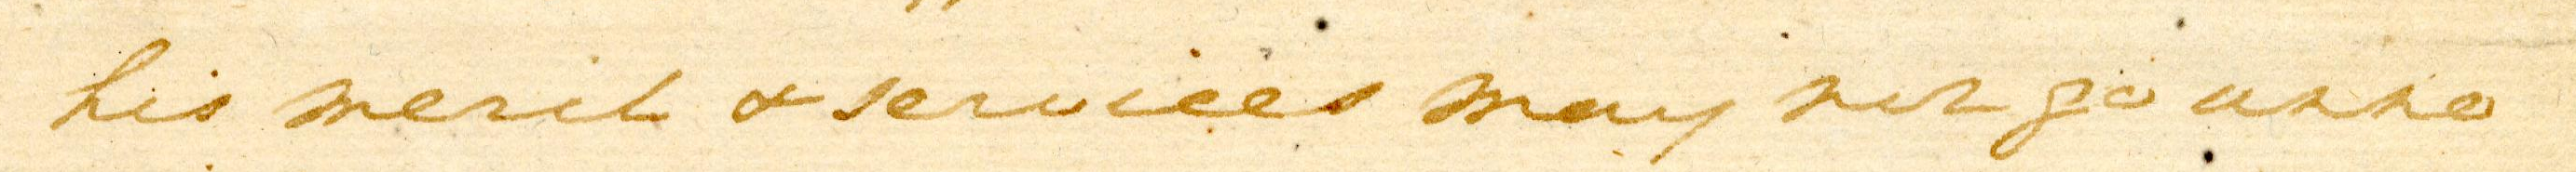his merit & services may not go unno
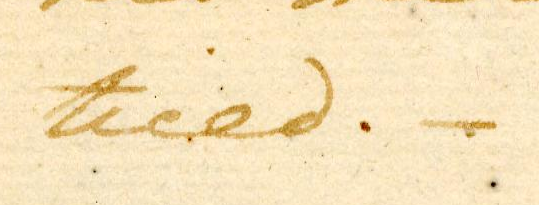ticed.-
